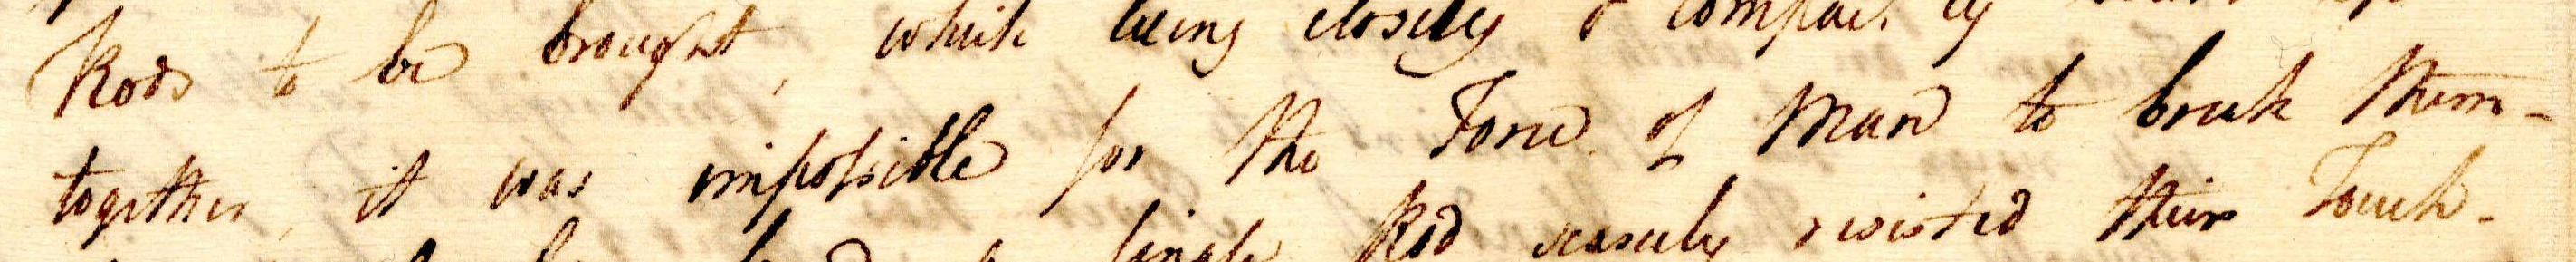together it was impossible for the Force of Man to break them.
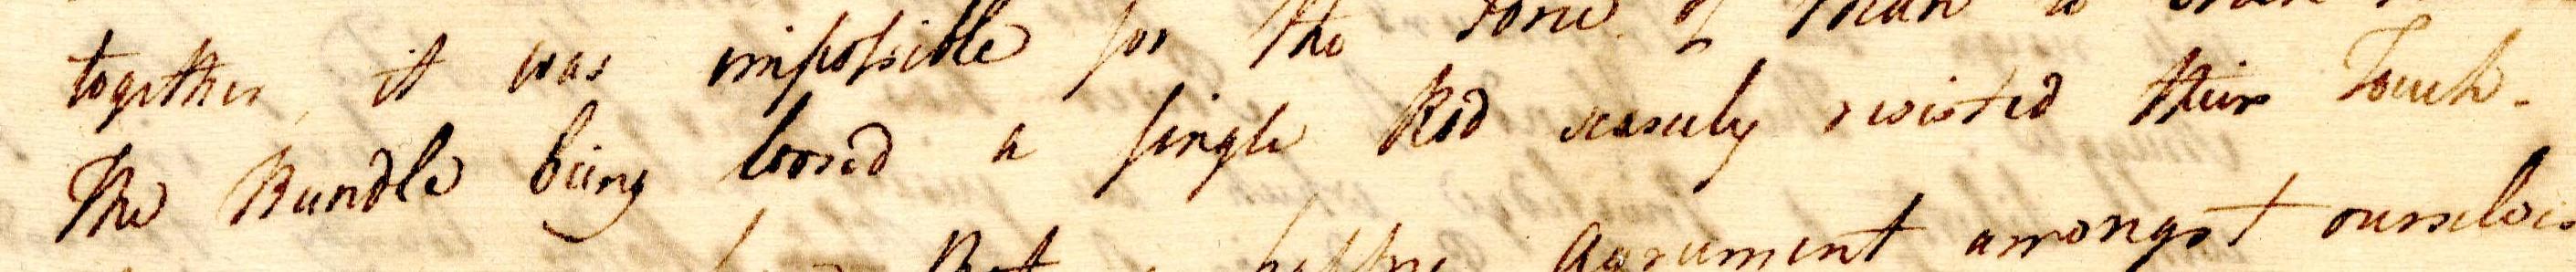The Bundle being loosed a Single Rod seasuly twisted their Touch.
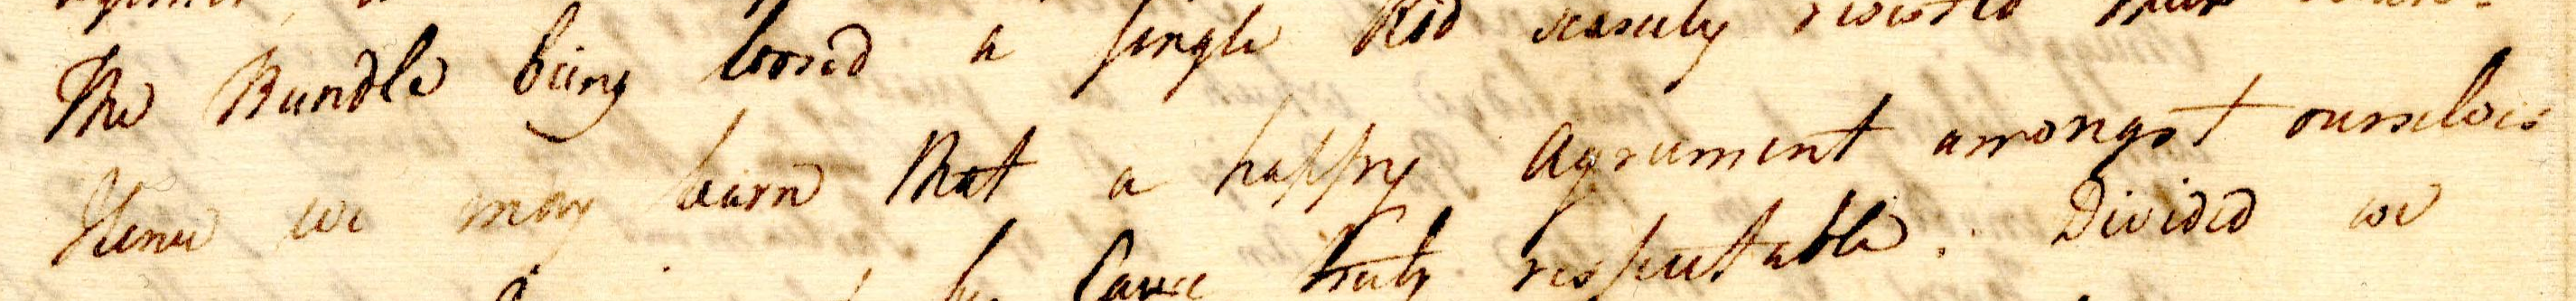Hence we may learn that a happy Agreement amongst ourselves
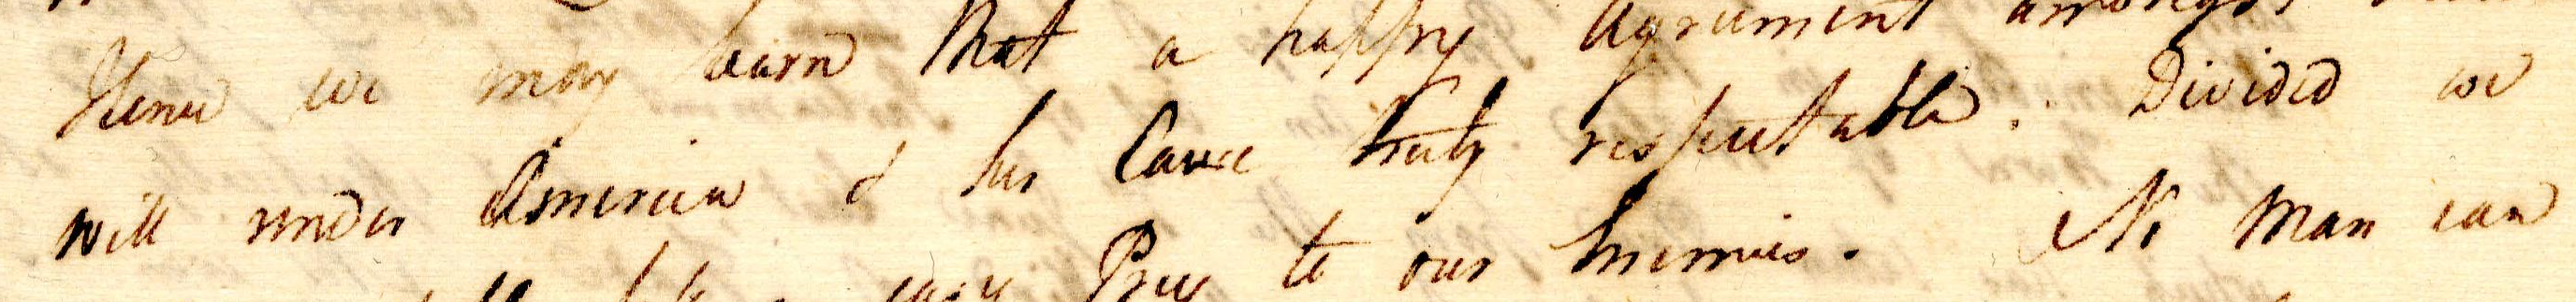will under America & her Cause truly respectable. Divided we
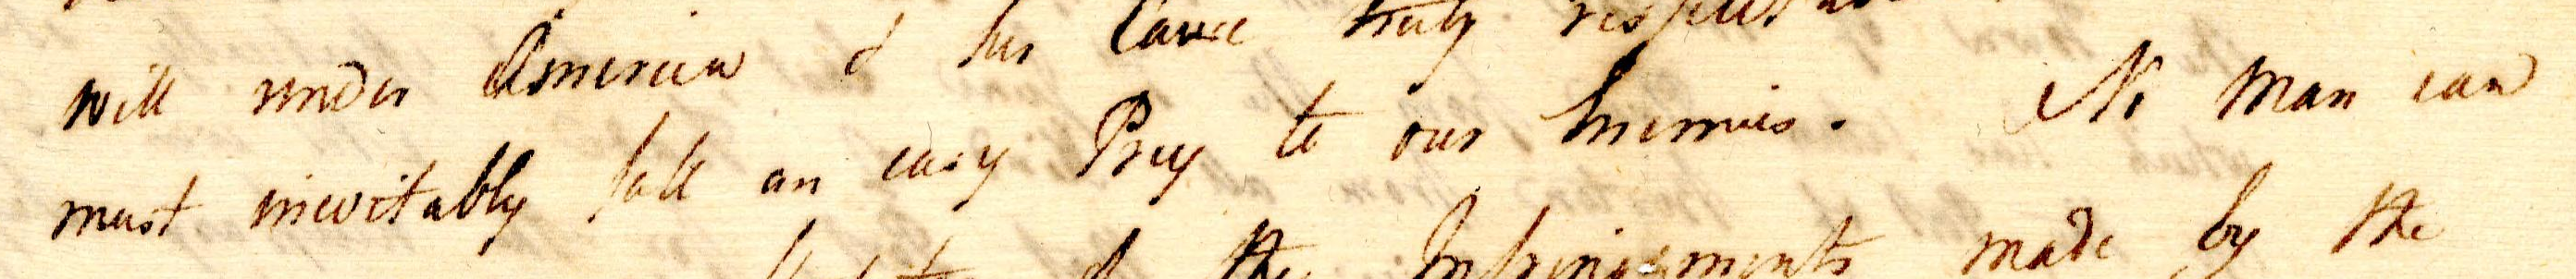most inevitably fall an easy Prey to our Enemies. No man can
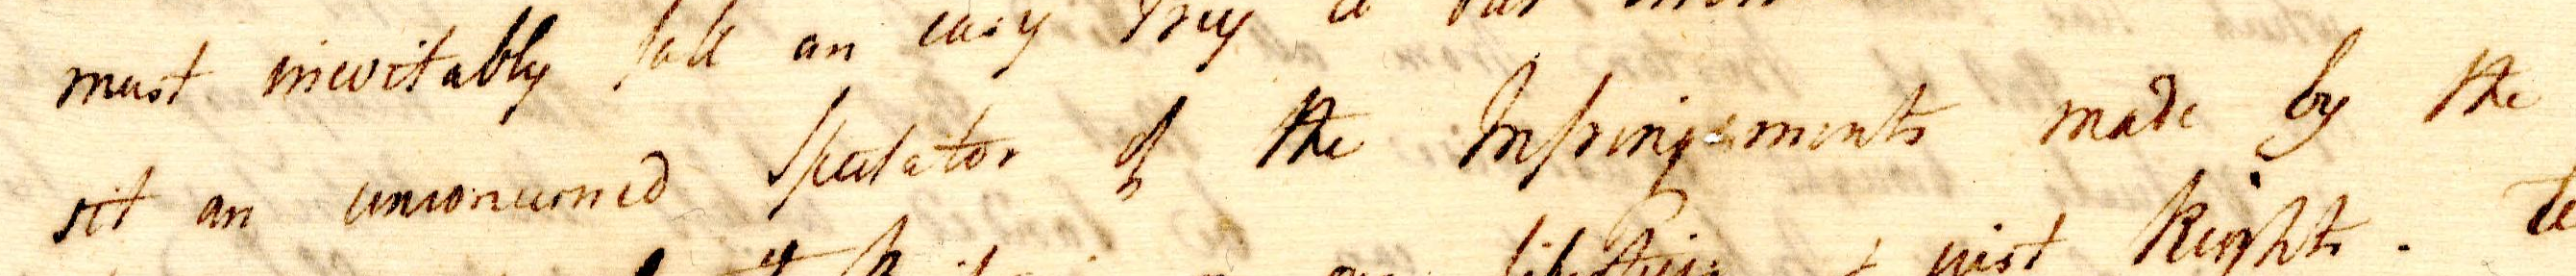sit an announced Spectator of the Infringements made by the
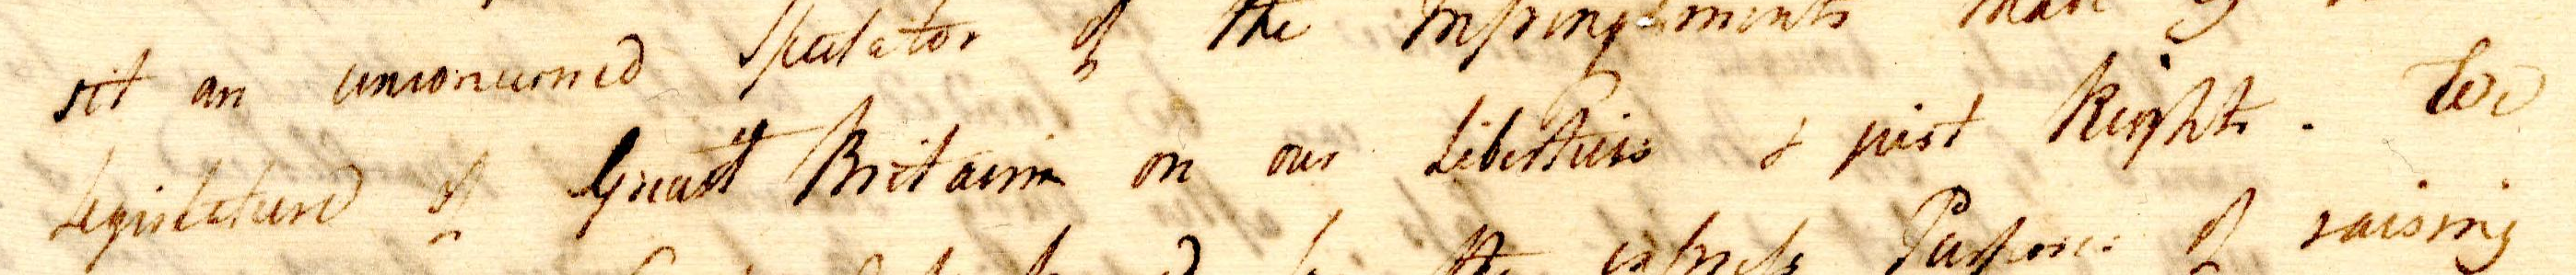Legislature of Great Britain on our Liberties & just Right. We
